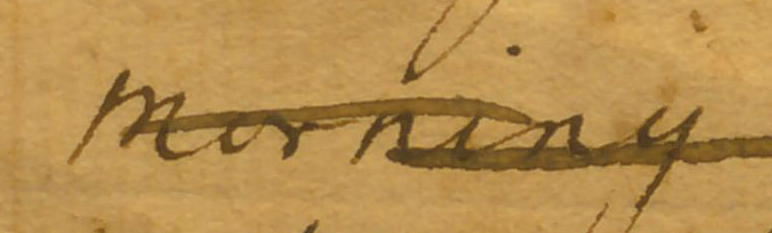morning
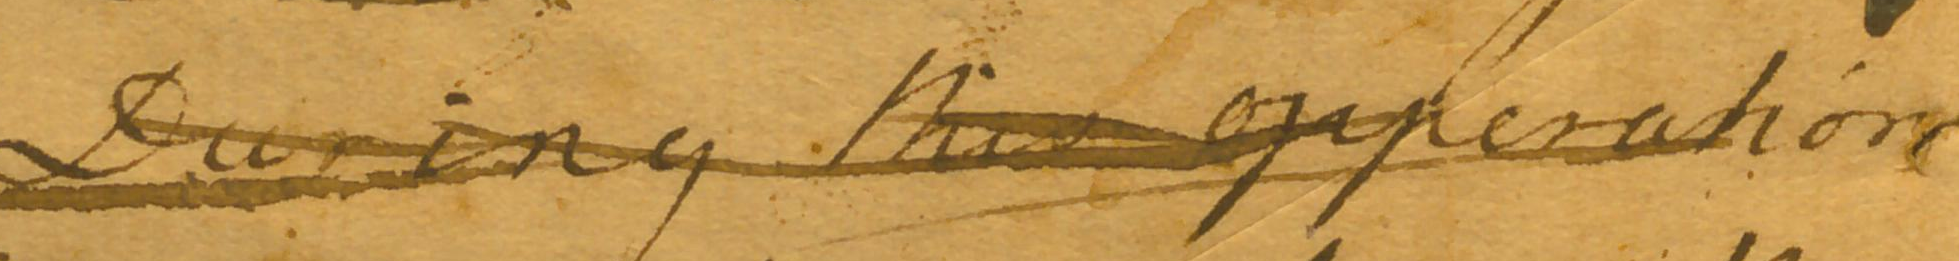During the opperation
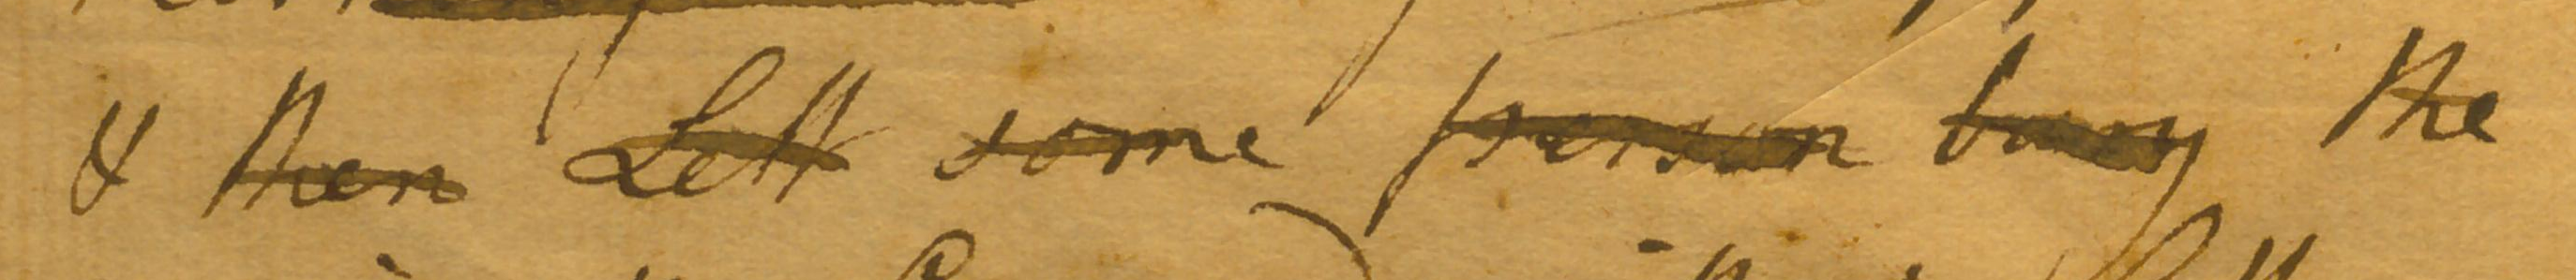& then Lett some person bury the
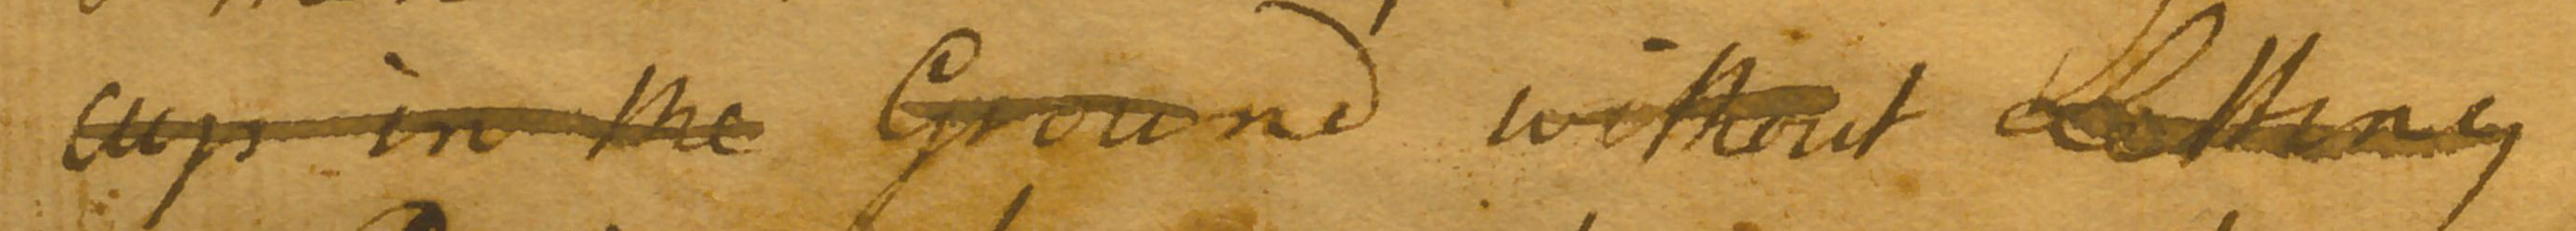cup in the Ground without Letting
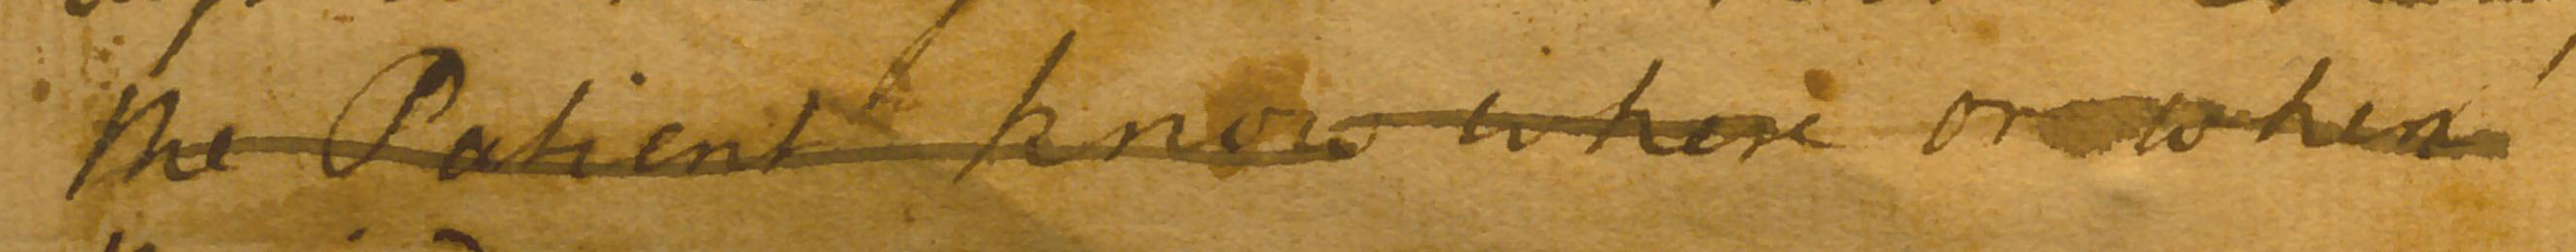the Patient know where or when
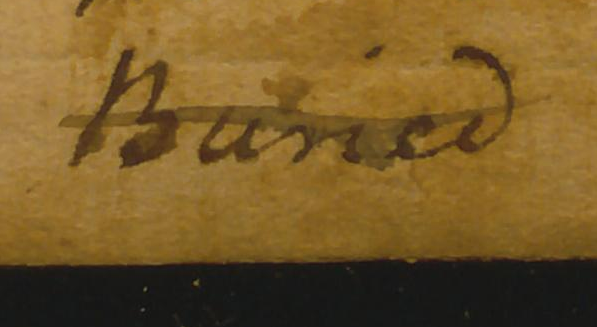Buried
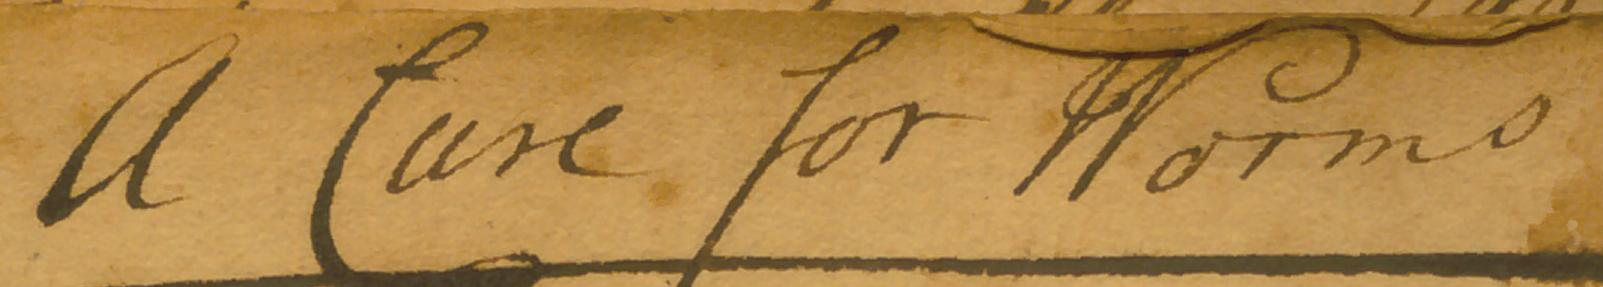A Cure for Worms
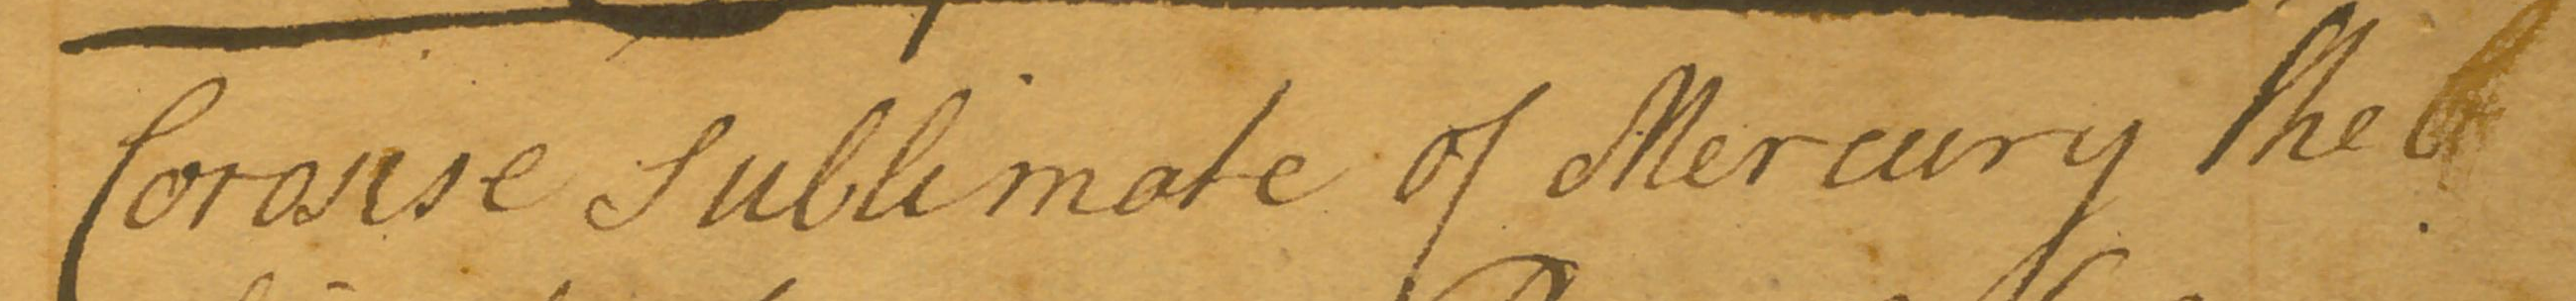Corosive sublimate of Mercury the
